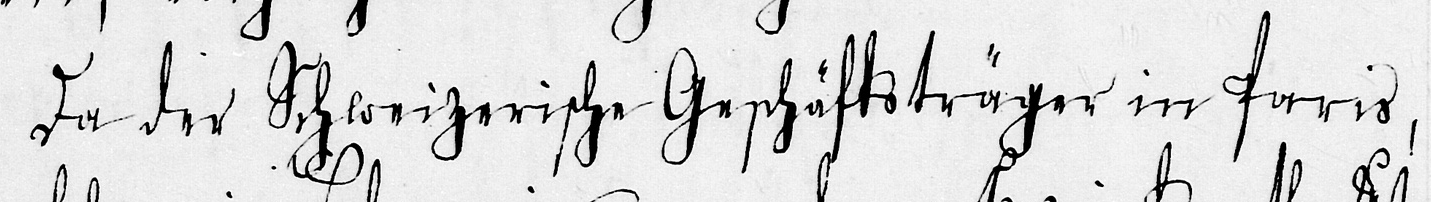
Da der Schweizerische Geschäftsträger in Paris,
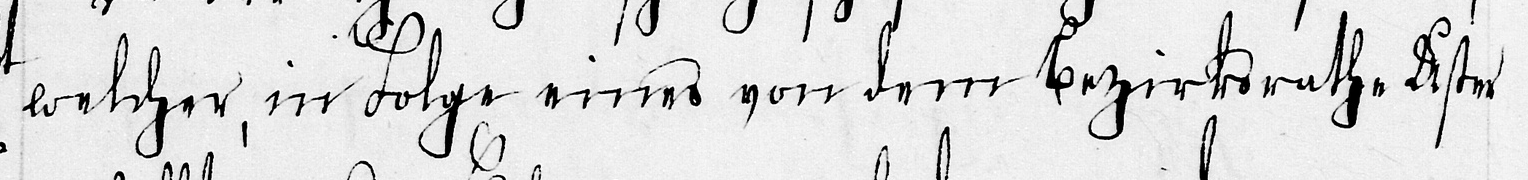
welcher, in Folge eines von dem Bezirksrathe Uster
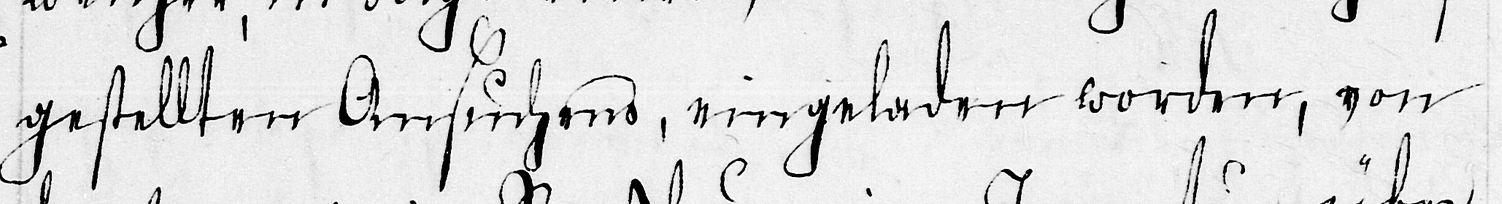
gestellten Ansuchens, eingeladen worden, von
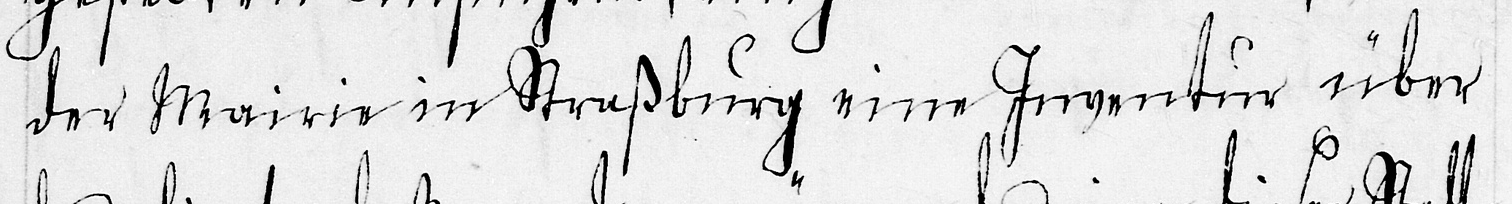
der Mairie in Straßburg eine Inventur über
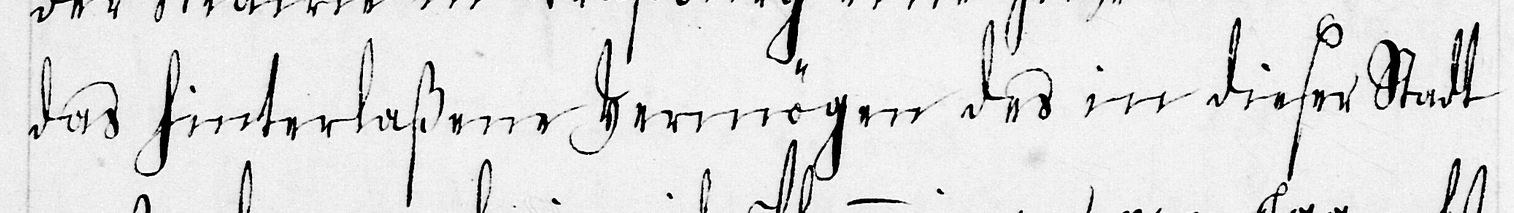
das hinterlaßene Vermögen des in dieser Stadt
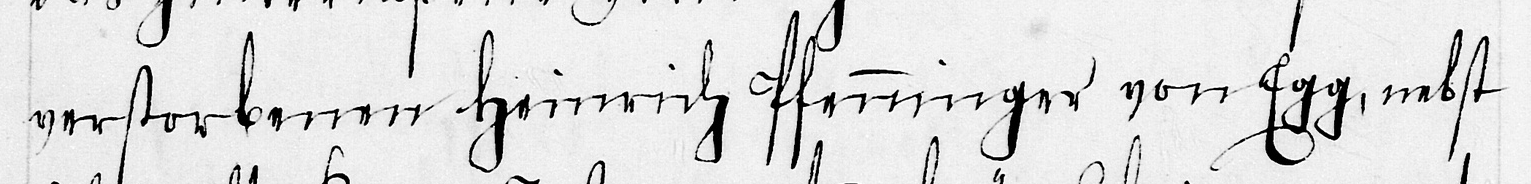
verstorbenen Heinrich Pfenninger von Egg, nebst
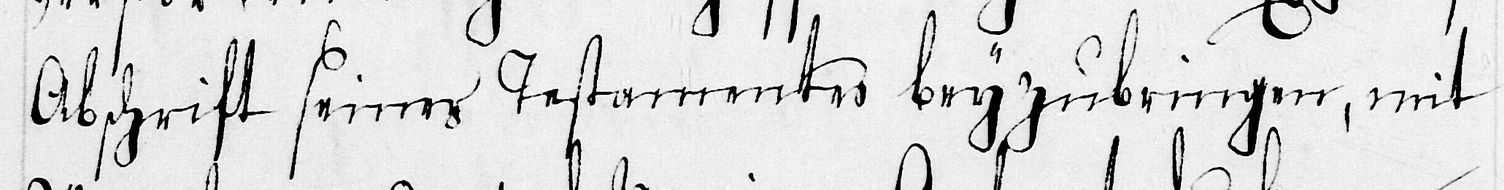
Abschrift seines Testamentes beyzubringen, mit
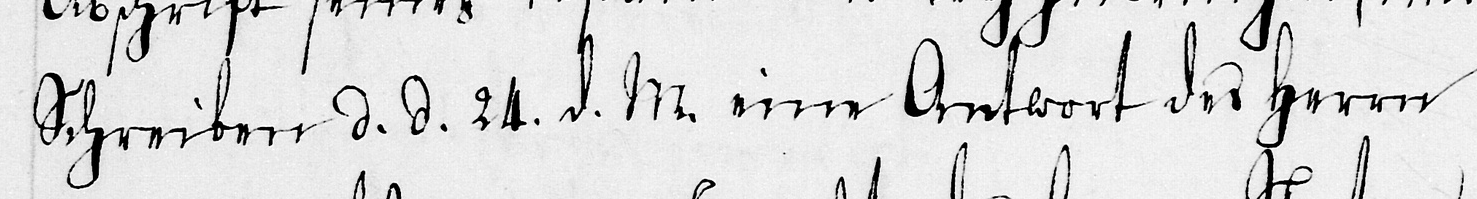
Schreiben d. d. 24. d. M. eine Antwort des Herrn
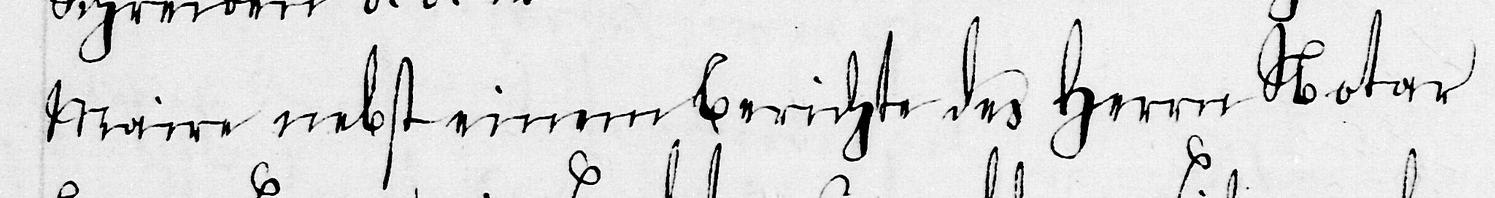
Maire nebst einem Berichte des Herrn Notar
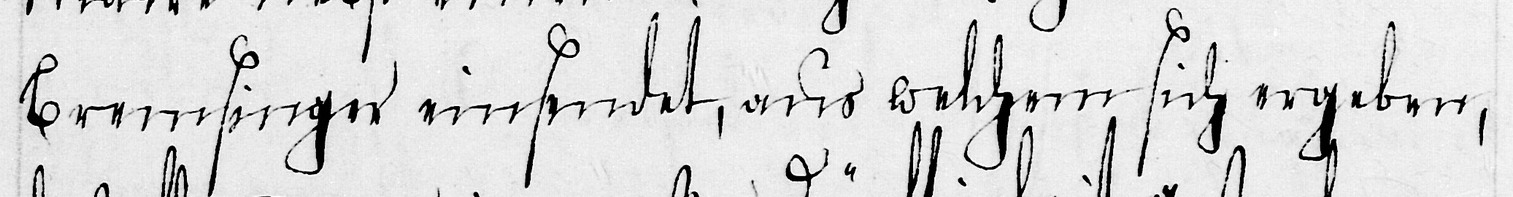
Bremsinger einsendet, aus welchem sich ergeben,
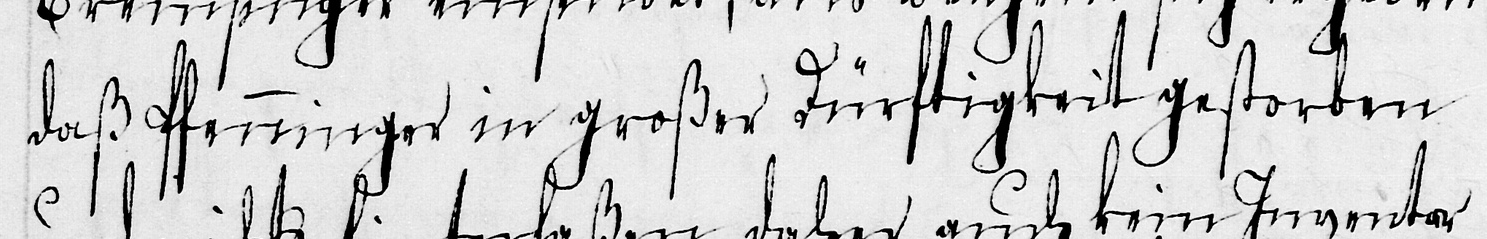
daß Pfenninger in großer Dürftigkeit gestorben
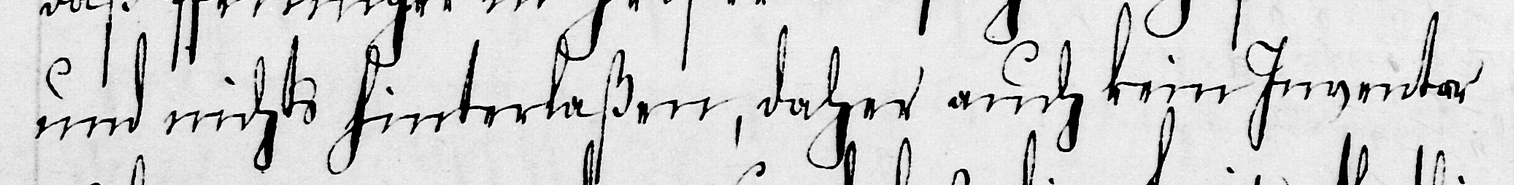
und nichts hinterlaßen, daher auch kein Inventar
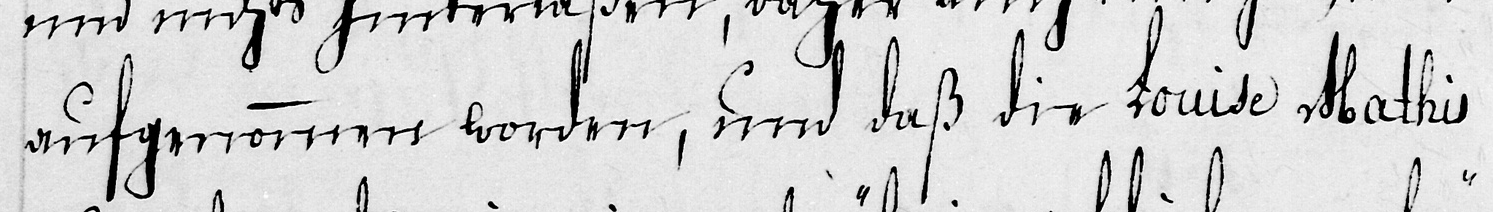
aufgenommen worden, und daß die Louise Mathis
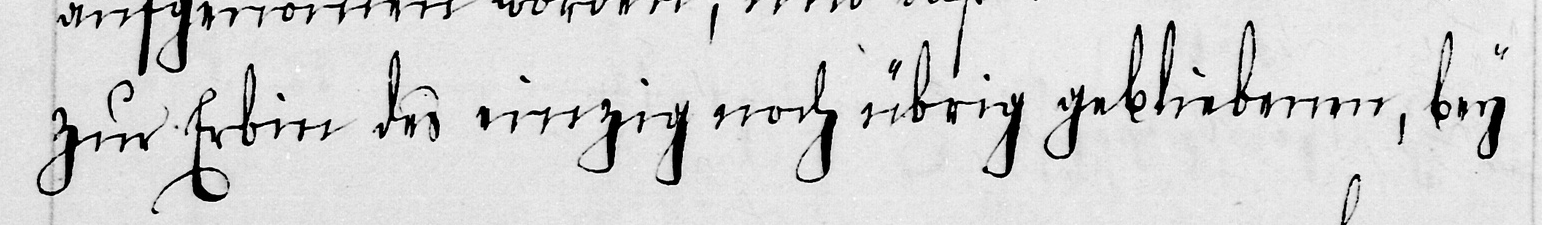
zur Erbin des einzig noch übrig gebliebenen, bey
